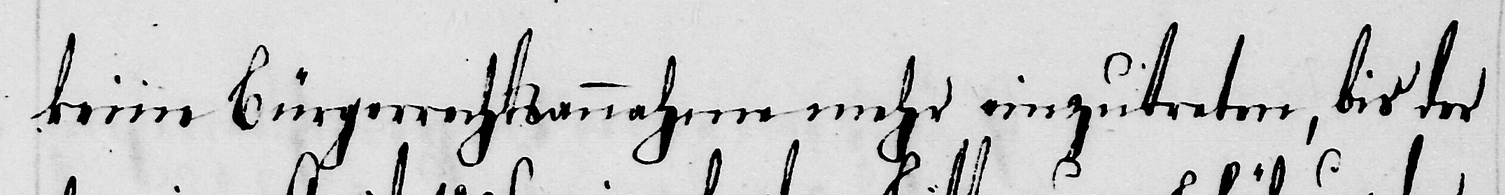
keine Bürgerrechtsannahme mehr einzutreten, bis der
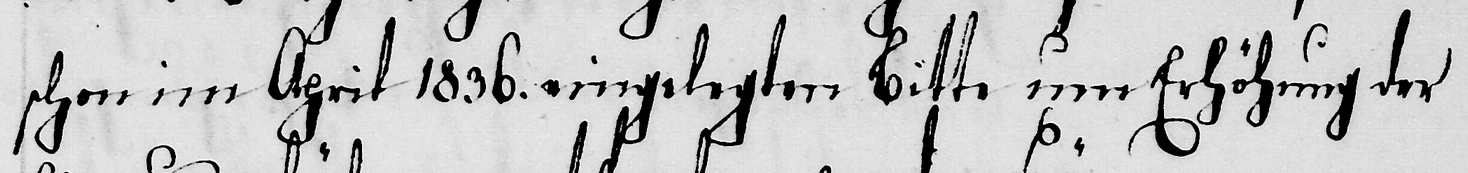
schon im April 1836. eingelegten Bitte um Erhöhung der
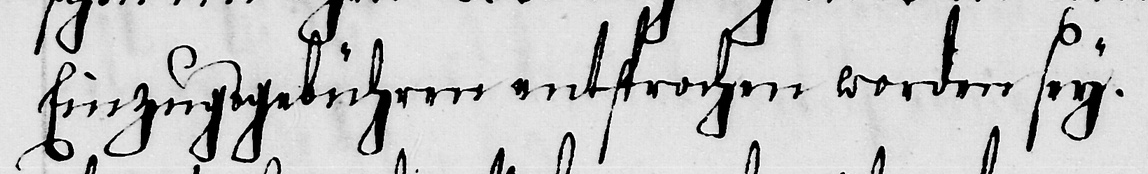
Einzugsgebühren entsprochen worden sey.
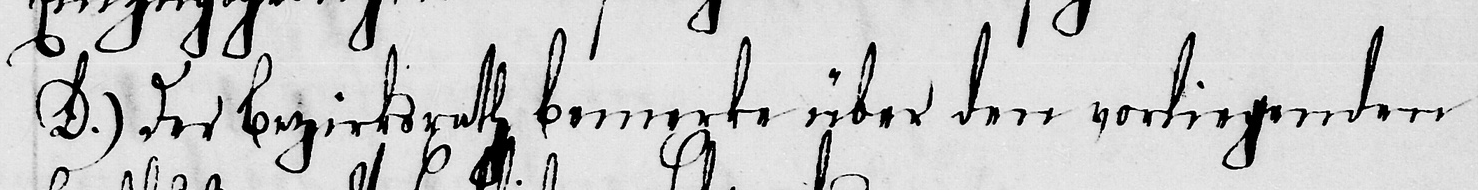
D.) Der Bezirksrath bemerke über den vorliegenden
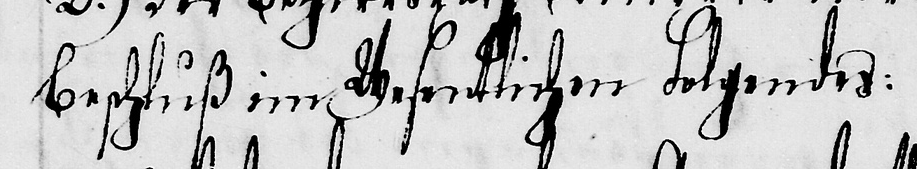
Beschluß im Wesentlichen Folgendes:
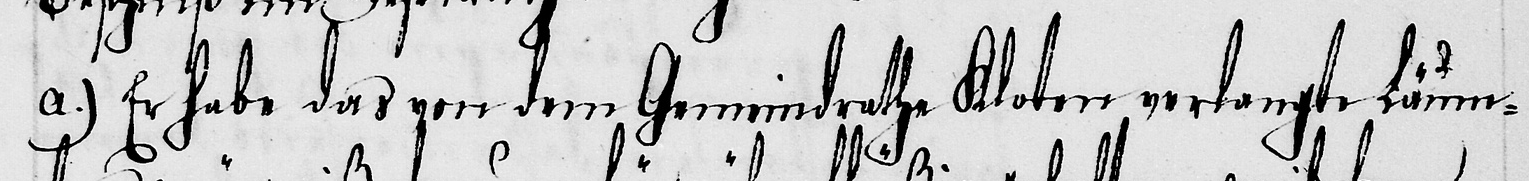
a.) Er habe das von dem Gemeindrathe Kloten verlangte Läum¬
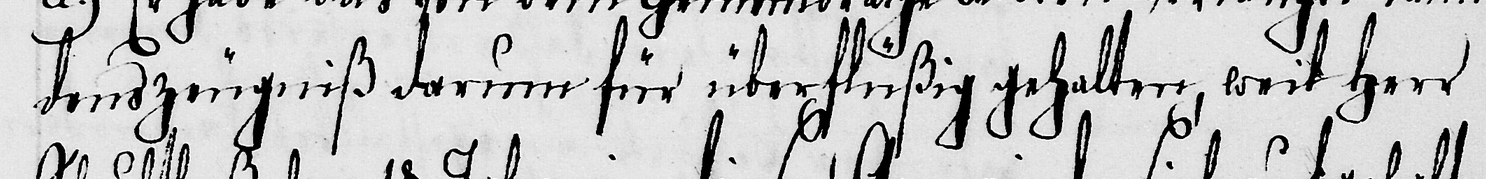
deszeugniß darum für überflüßig gehalten, weil Herr
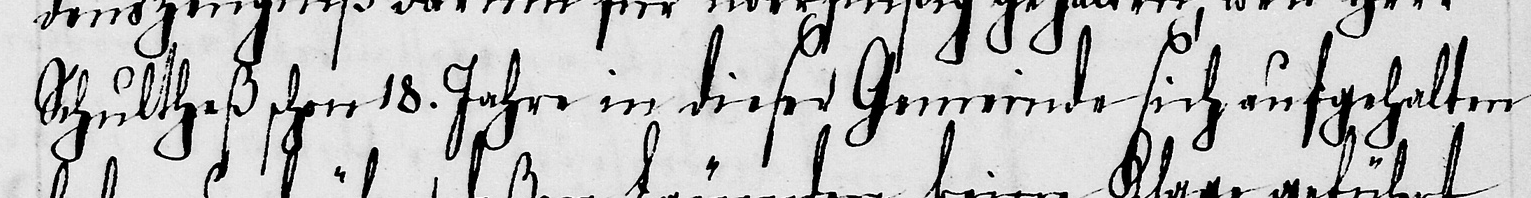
Schultheß schon 18. Jahre in dieser Gemeinde sich aufgehalten
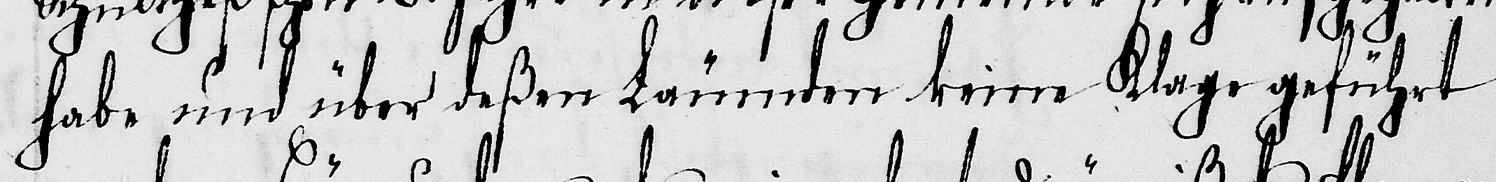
habe und über deßen Läumden keine Klage geführt
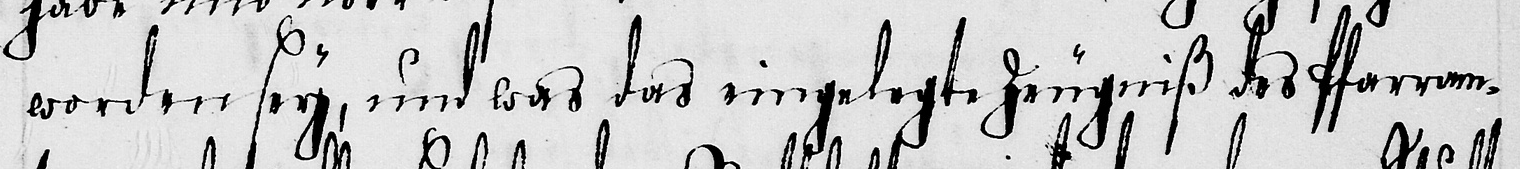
worden sey, und was das eingelegte Zeugniß des Pfarram¬
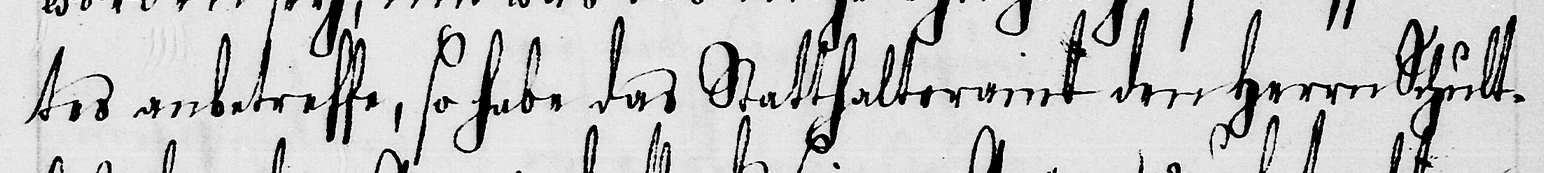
tes anbetreffe, so habe das Statthalteramt den Herrn Schult¬
